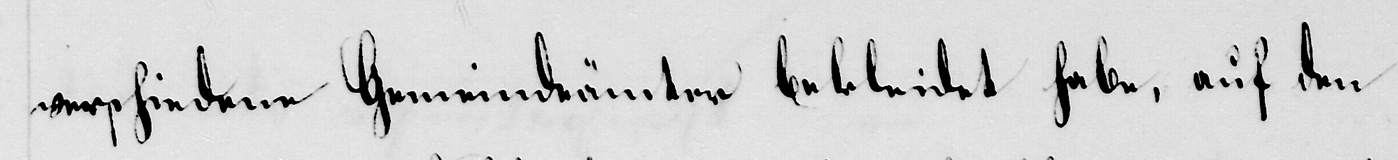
verschiedene Gemeindämter bekleidet habe, auf den
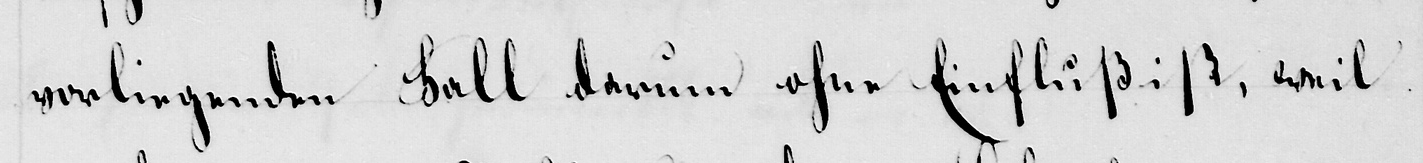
vorliegenden Fall darum ohne Einfluß ist, weil
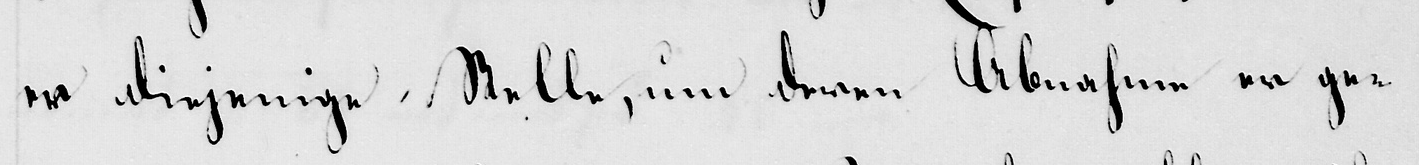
er diejenige Stelle, um deren Abnahme er ge¬
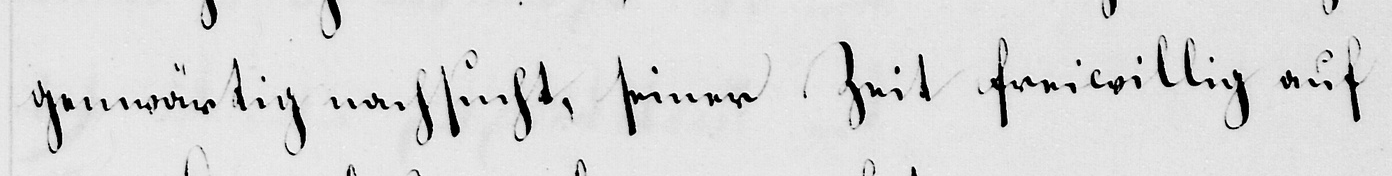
genwärtig nachsucht, seiner Zeit freiwillig auf
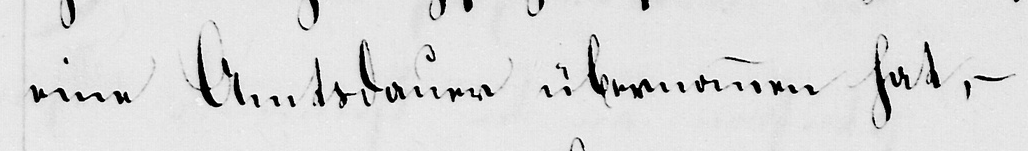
eine Amtsdauer übernommen hat, –
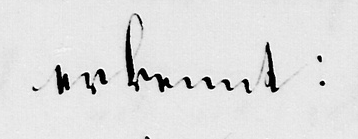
erkennt:
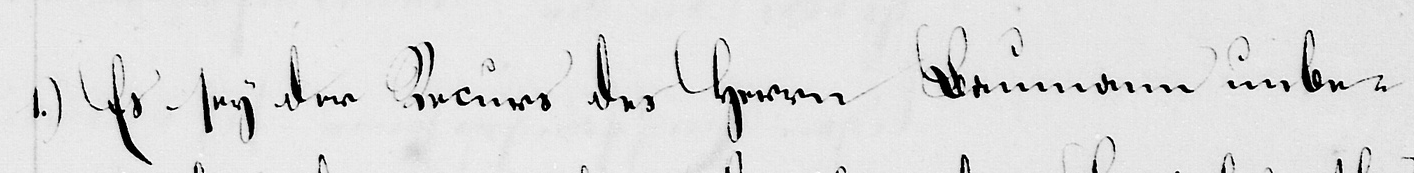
1.) Es sey der Recurs des Herrn Baumann unbe¬
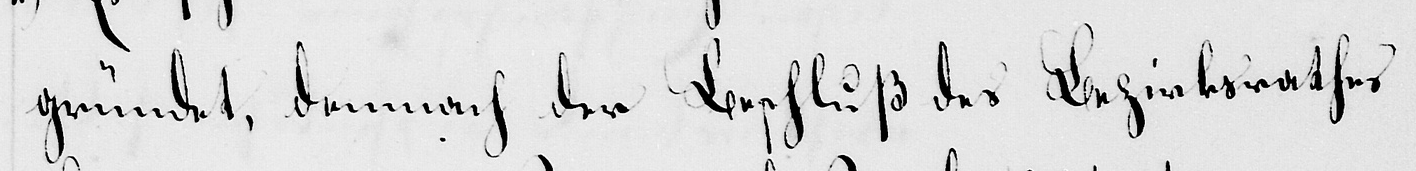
gründet, demnach der Beschluß des Bezirksrathes
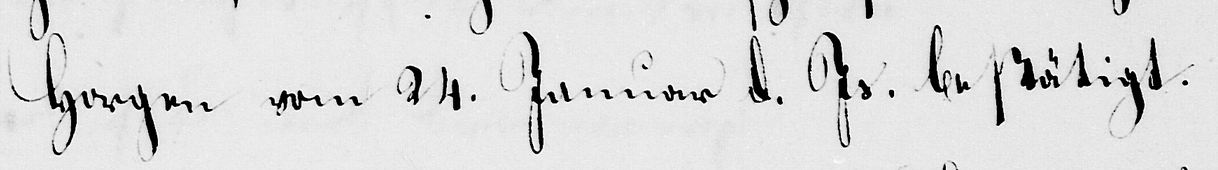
Horgen vom 24. Januar d. Js. bestätigt.
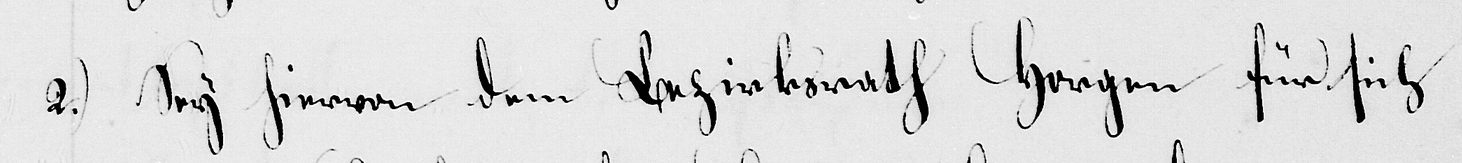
2.) Sey hiervon dem Bezirksrath Horgen für sich
